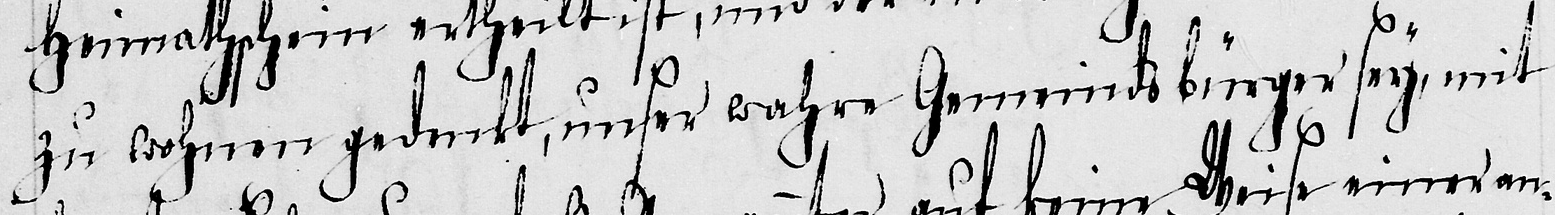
zu wohnen gedenkt, unser wahre Gemeindsbürger sey, mit
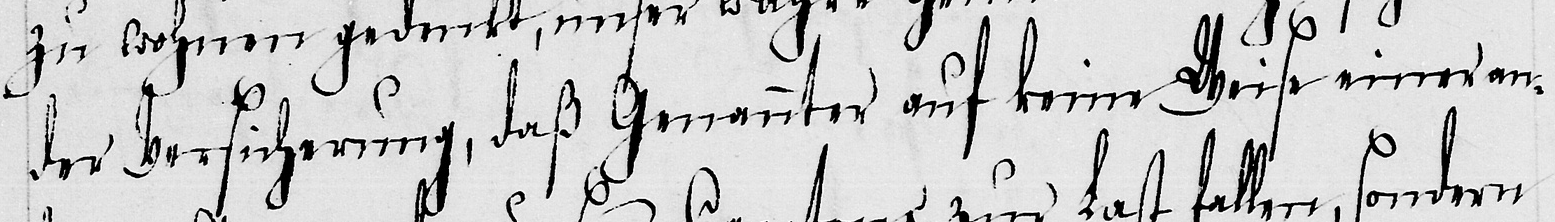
der Versicherung, daß Genannter auf keine Weise einer an¬
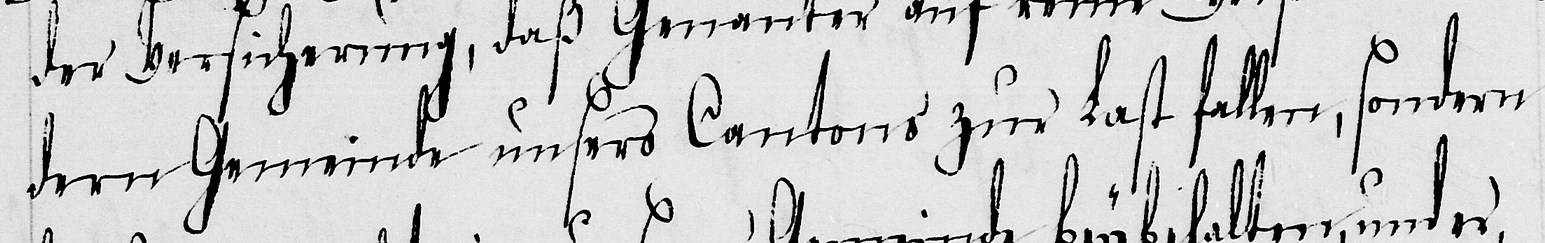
deren Gemeinde unsers Cantons zur Last fallen, sondern
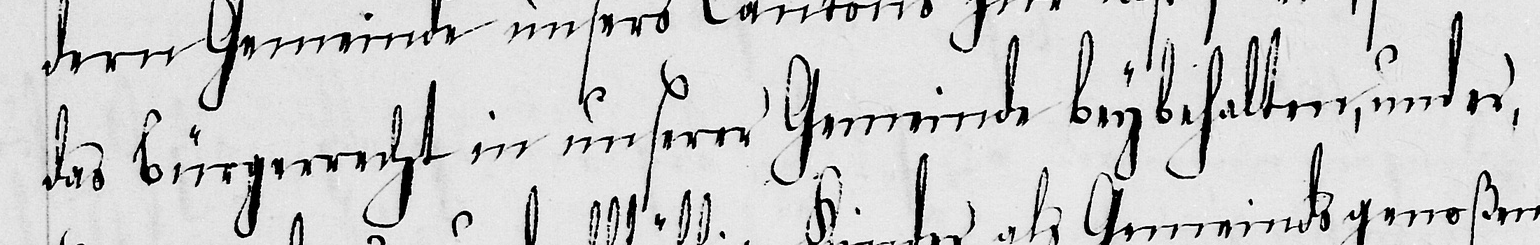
das Bürgerrecht in unserer Gemeinde beybehalten, und er,
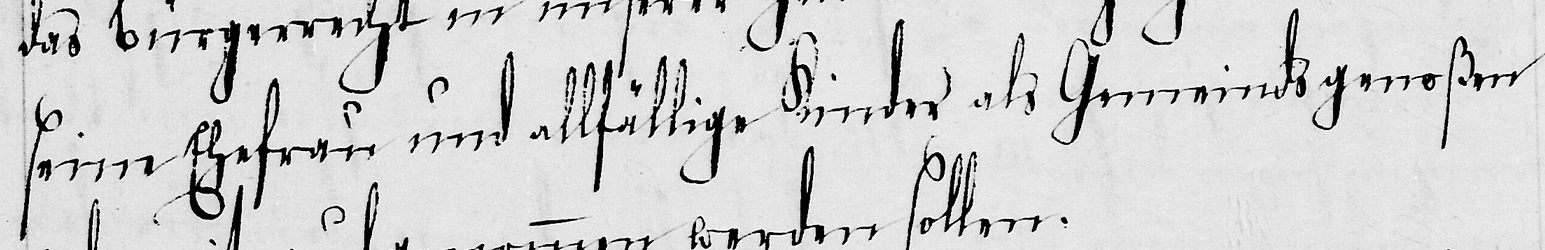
seine Ehefrau und allfällige Kinder als Gemeindsgenoßen
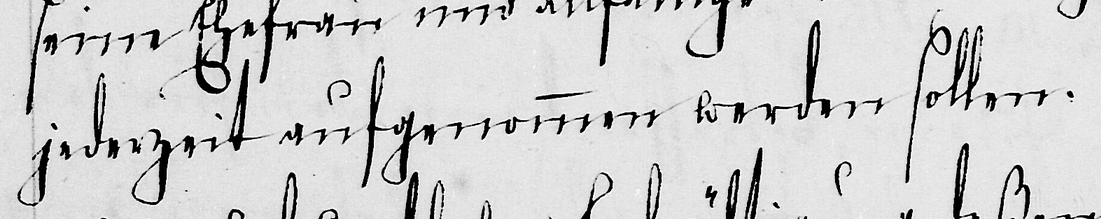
jederzeit aufgenommen werden sollen.
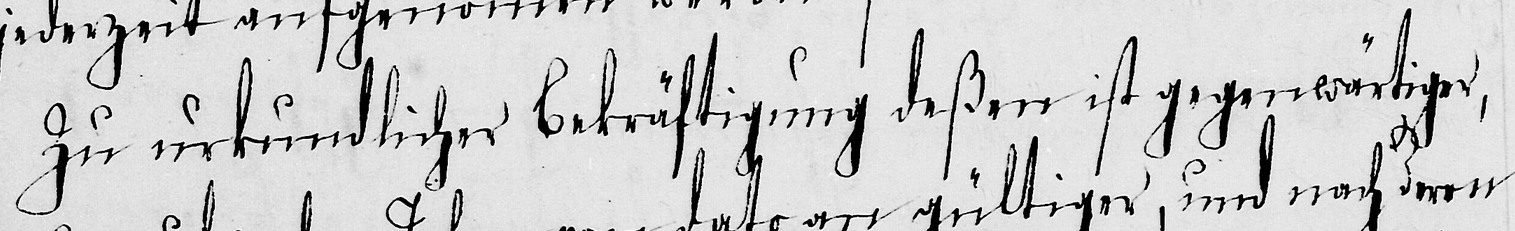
Zu urkundlicher Bekräftigung deßen ist gegenwärtiger,
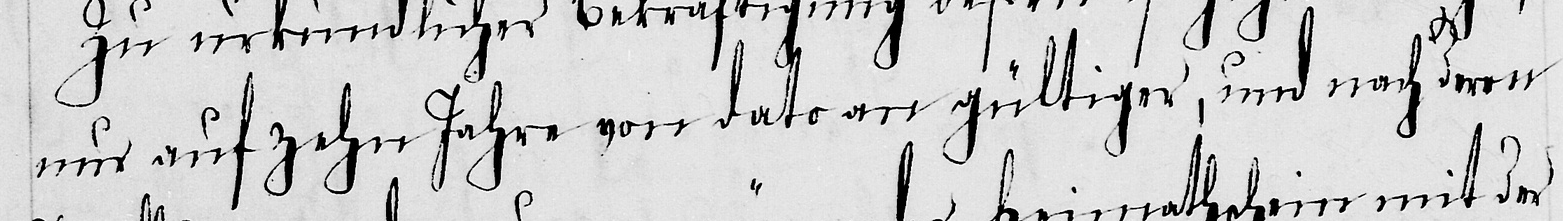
nur auf zehn Jahre von dato an gültiger, und nach deren
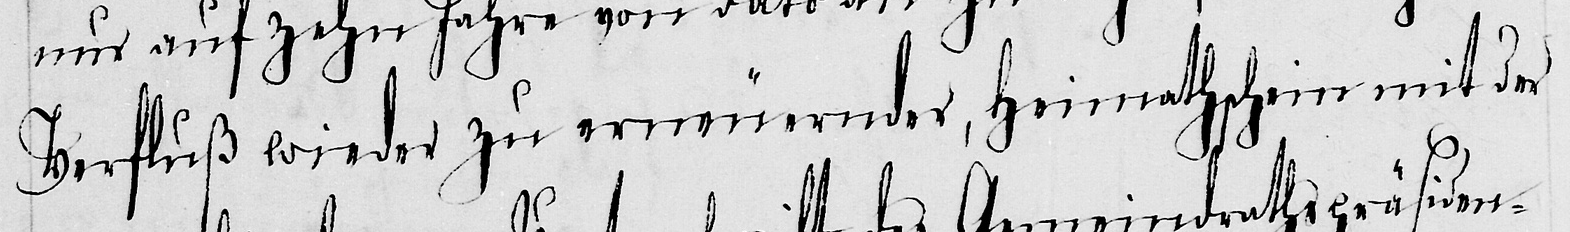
Verfluß wieder zu erneuernder, Heimathschein mit der
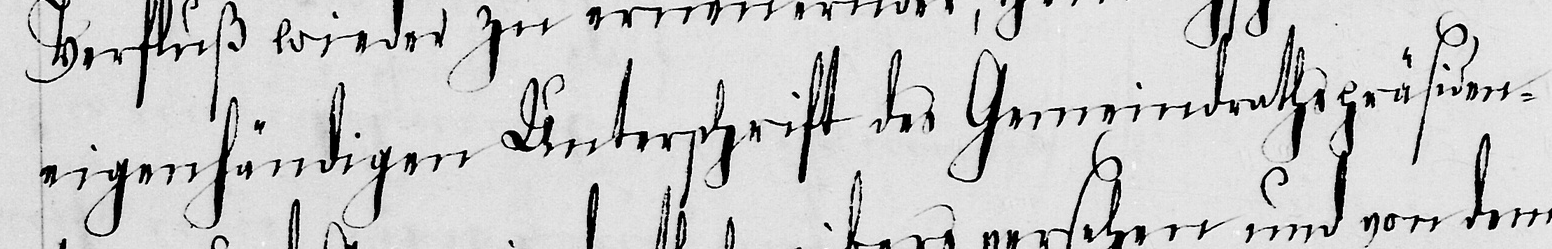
eigenhändigen Unterschrift des Gemeindrathspräsiden¬
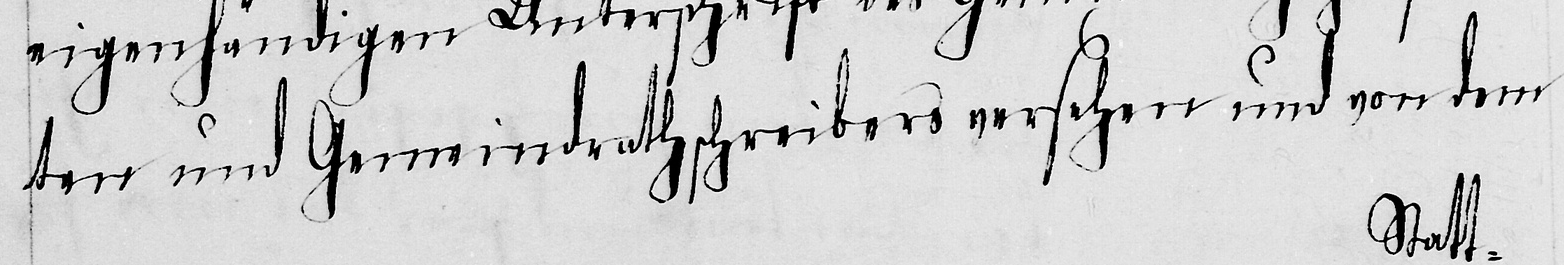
ten und Gemeindrathschreibers versehen und von dem
